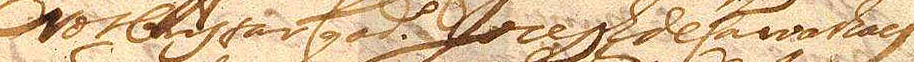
Nos constar q̄ o d.o Jozeph de Carvalhaes
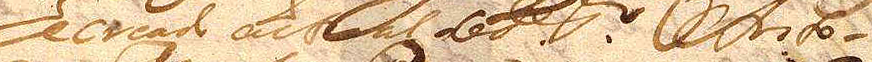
he creado actual do d.o so.r Anto
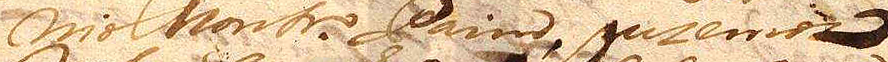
nio Montr.o Paim, puzemos
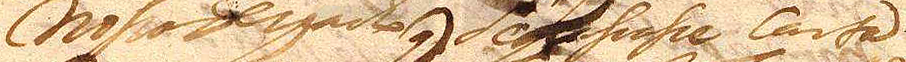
nosso despacho q̄ se passasse carta
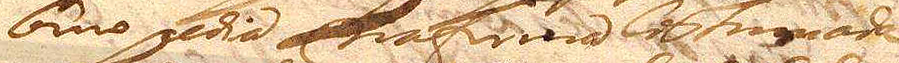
como pedia na forma Costumada
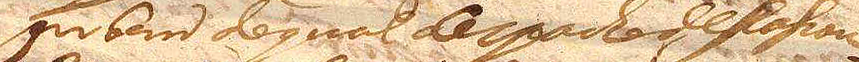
por bem de qual despacho desossou
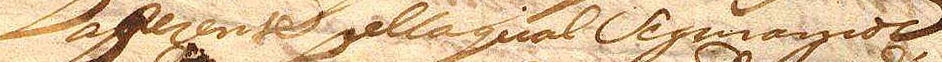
a prezente pella qual seguramos
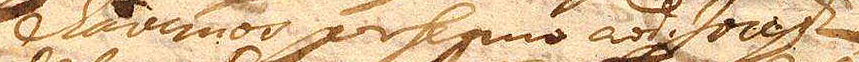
e havemos por seguro ao d.o Jozeph
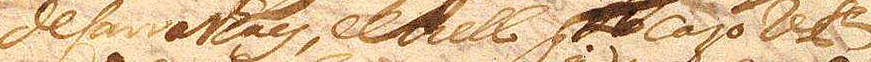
de Carvalhaes, e Mello p.Lo cazo Refe
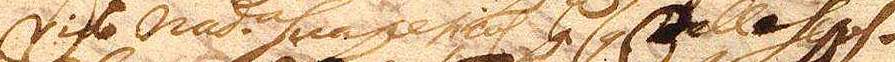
rido na d.a sua petiçaõ p.a q̄ della se pos
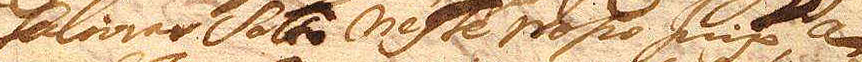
sa livrar Solto neste nosso Juizo a
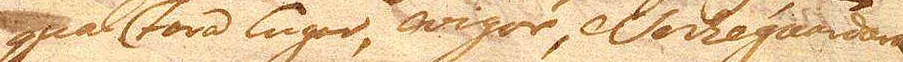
qual tera lugar, e vigor, e se lhe guardara
